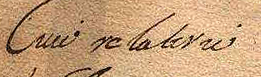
Cuio relatorio
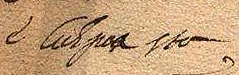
e Culpaa sta
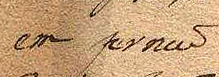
em fernaõ
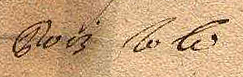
Roiz lobo
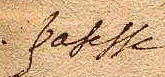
pasesse
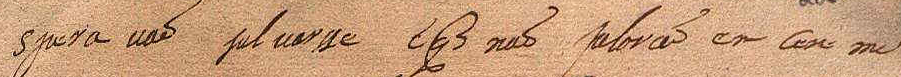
sperauão saluarsse e q̄ não falarão em ceremo
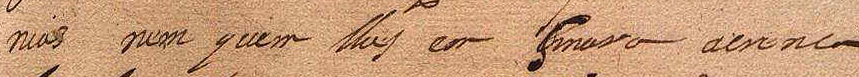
nias nem quem lhes emsinara a crença
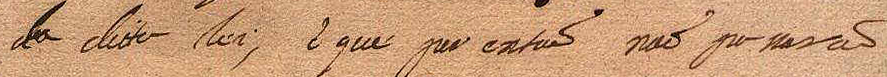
da ditta lei, e que per então não passaraõ
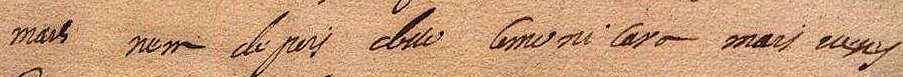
mais nem depois disso comonicara mais ueses
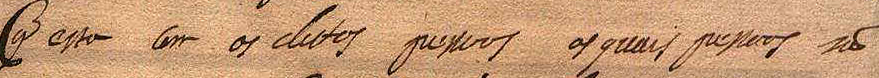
q̄ esta com as dittas pessoas as quais pessoas são
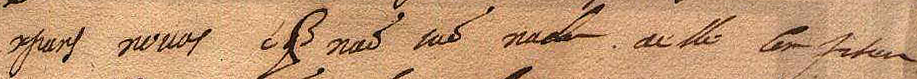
xpans nouas e q̄ naõ saõ nada a elle comfiten
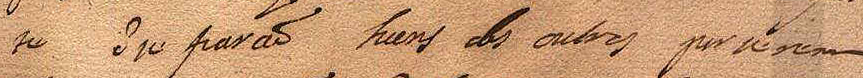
te e se fiaraõ huns dos outros por serem
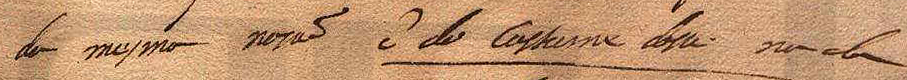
da mesma nasão e do custume disse nada
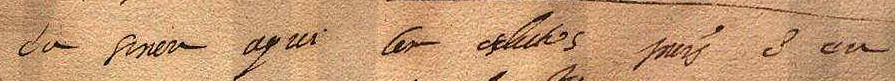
e asinou aqui com os dittos snors̄ e eu
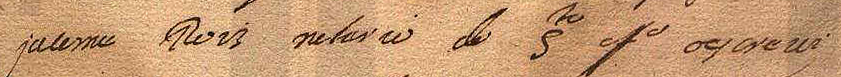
jacome Roiz notario do Sto offo o escreui
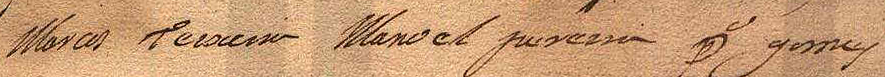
Marcos Teixeira Manoel pereira Po gomes
